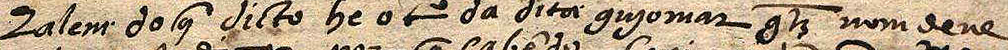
E alem do q̄ dicto he o to da dita gujomar ḡlz nom deue
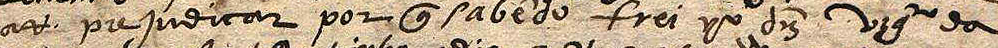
a R preJudicar porq̄ sabēdo frei yo dīz vigro da
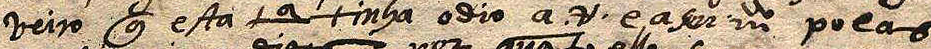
veiro q̄ esta ta tinha odio a R e a seu mdo polas
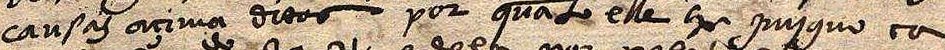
causas acima ditas por qūato elle he Jmjguo ca
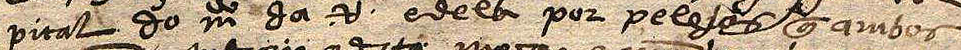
pitaL do mdo da R e dela por peleJas q̄ ambos
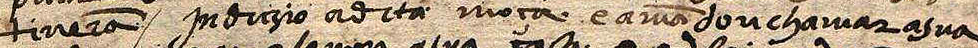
tiuer̄a / Jnduzio a dita moça e a mādou chamar a sua
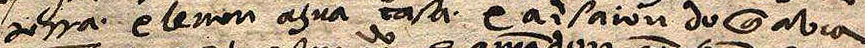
terra e leuou a sua casa a ēsaiou do q̄ avia
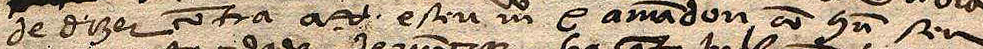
de dizer c̄otra a R e seu mdo e a m̄adou c̄o hū seu
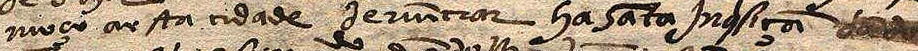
moço a esta cidade denūciar ha Sāta Jnqisiçãm dāde lhe
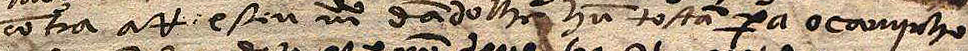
c̄otra a R e seu mdo dādolhe hū tostā ꝑa o camjnho
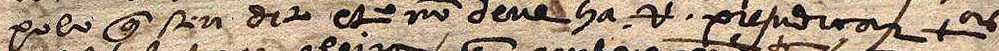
polo q̄ seu dito e to nō deue ha R prejudicar tas
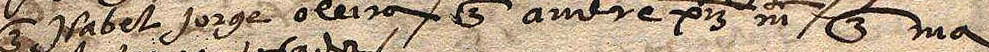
item JsabeL Jorge oleira / item andre p̄iz mte / item ma
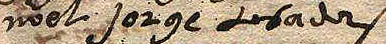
noeL Jorge tosador /
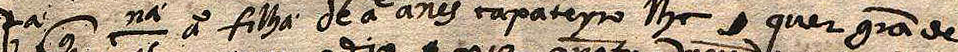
Pra q̄ cna ao filha de ae anes çapateyro lhe quer gr̄ade
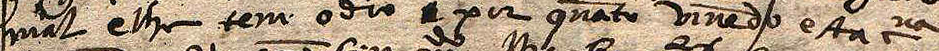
maL e lhe tem odio por qūato viuēdo esta cna
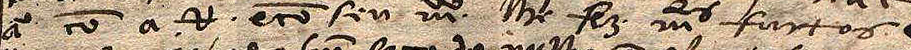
ao c̄o a R e c̄o seu mdo lhe fez mtos furtos e
